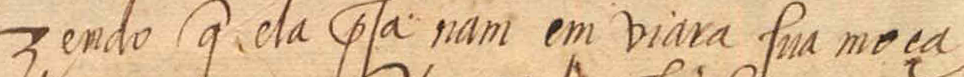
zendo q̅ ela p̄sa nam emviara sua moça
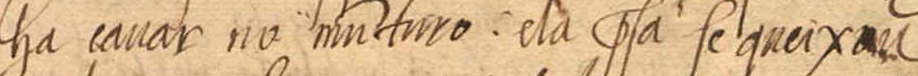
ha cauar no mu̅turo. ela p̄sa se queixou
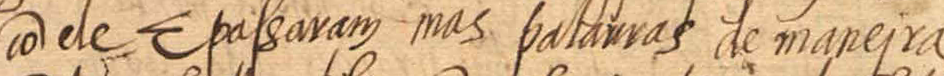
co̅ ele E passaram mas palauras de manejra
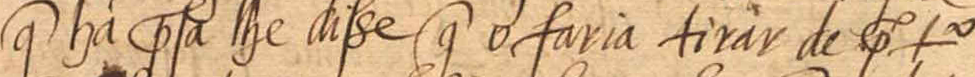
q̅ ha p̄sa lhe disse q̅ o faria tirar de p̄o to
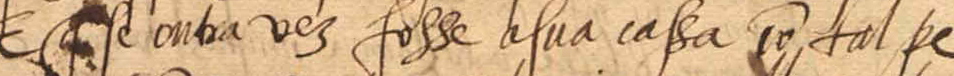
E q̅ se outra vez fosse a sua cassa c̅o tal pe
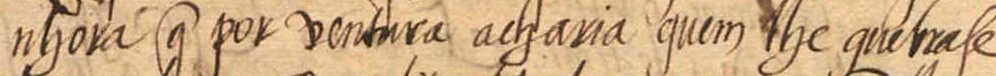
nhora q̅ porventura acharia quem lhe quebrase
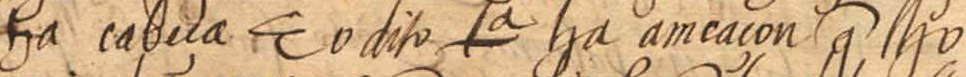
ha cabeça E o dito ta ha ameaçou q̅ lho
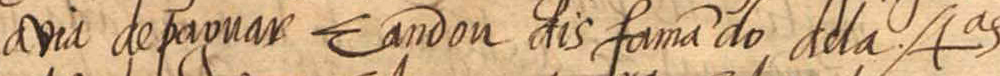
avia de paguar E andou disfama̅do dela. / tas.
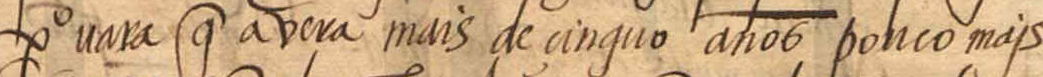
ꝓouara q̅ avera mais de çinquo an̄os pouco majs
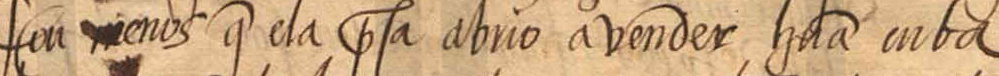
ou menos q̅ ela p̄sa abrio a vender hu̅a cuba
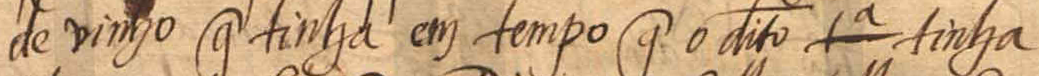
de vinho q̅ tinha em tempo q̅ o d̅ito ta tinha
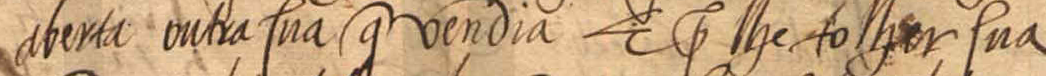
aberta outra sua q̅ vendia E p̄o lhe tolher sua
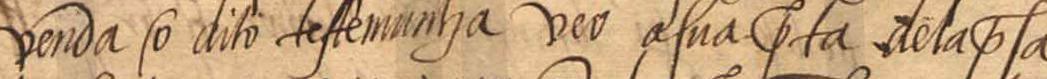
venda / o dito testemunha veo a sua p̄ota dela p̄sa
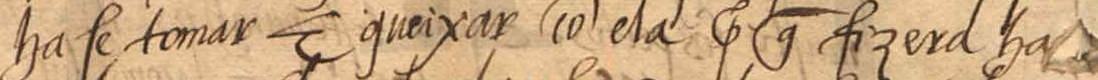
ha se tomar E queixar cō ela p̄o q̅ fizera ha
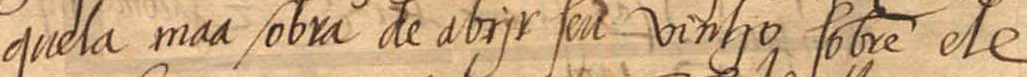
quela maa / obra de abrir seu vinho sobre ele
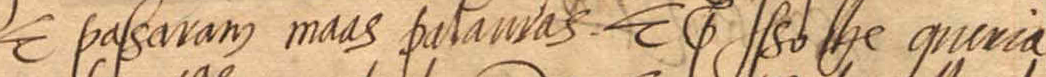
E passaram maas palauras E p̄o Jsso lhe queria
